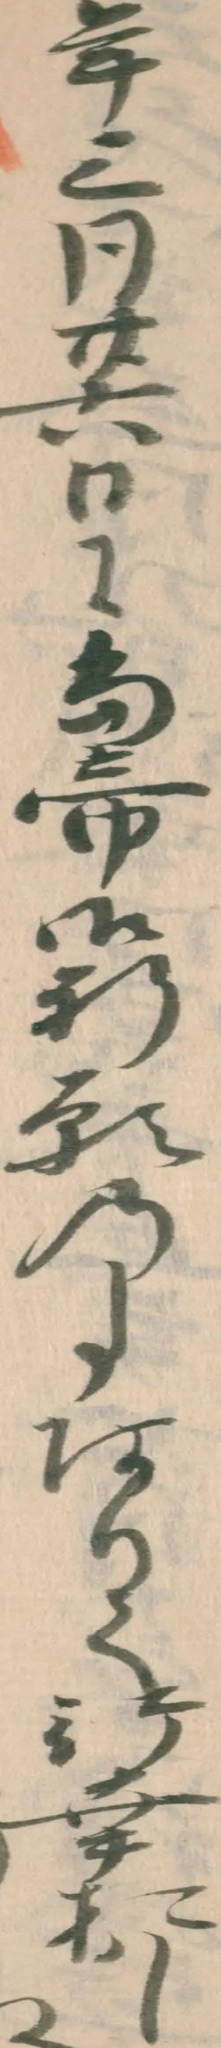年三月廿六日に当帝御祈願の事ありて行幸おはしましぬ
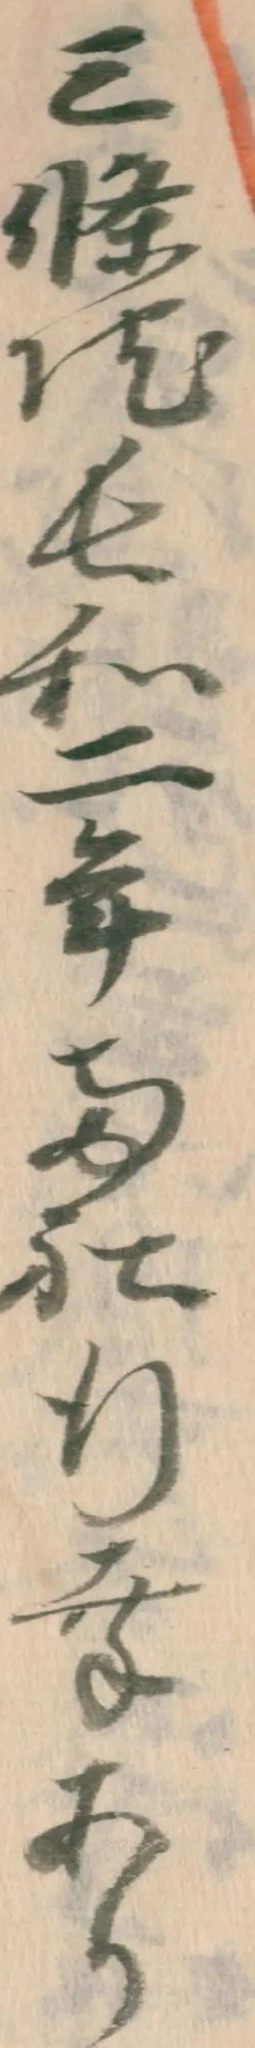三条院長和二年両社行幸あり
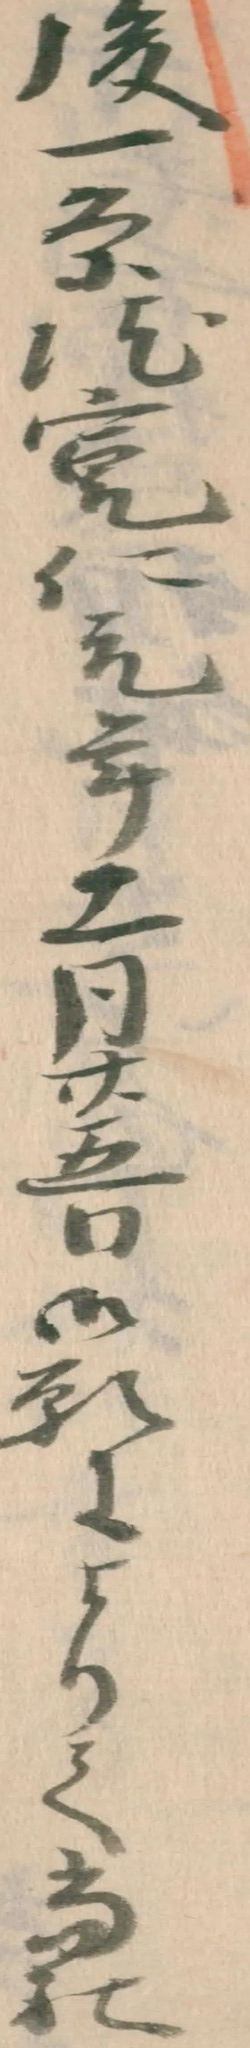後一条院寛仁元年十一月廿五日御願によりて当社
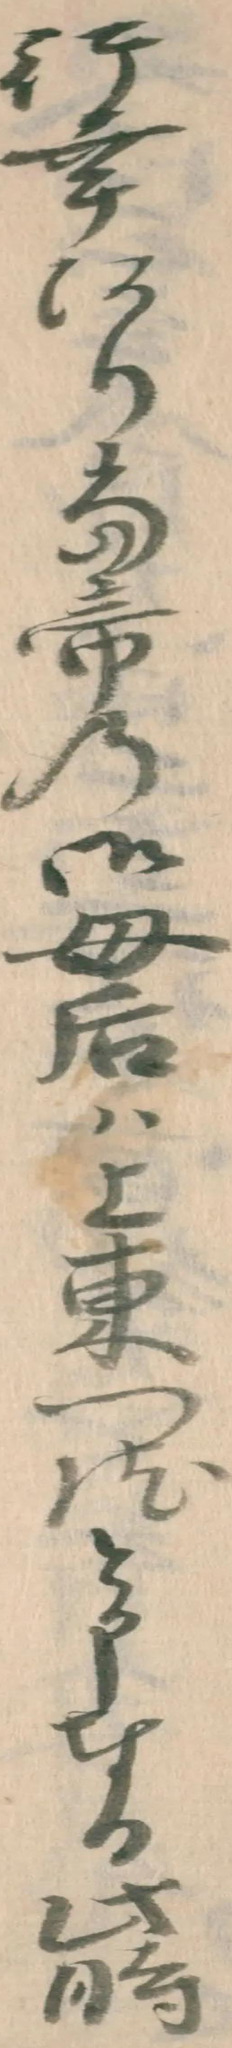行幸あり当帝の御母后は上東門院と申奉る此時
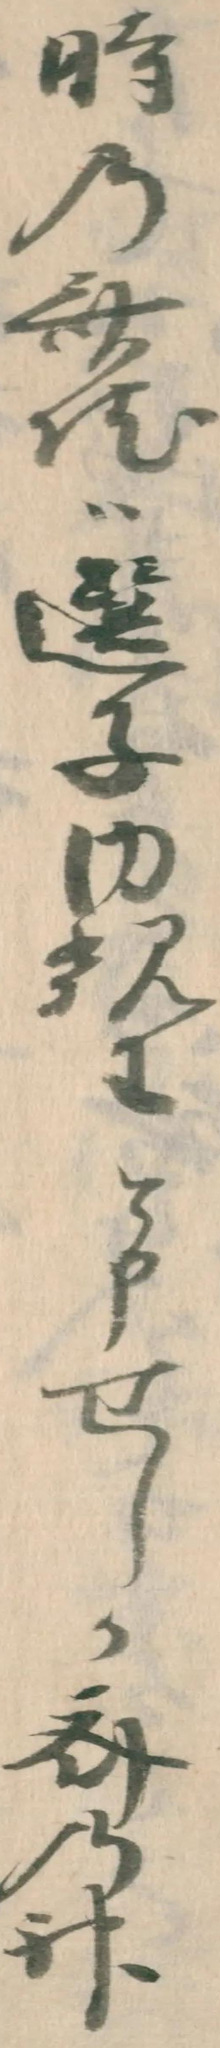時の斎院は選子内親王と申せしか斎の神
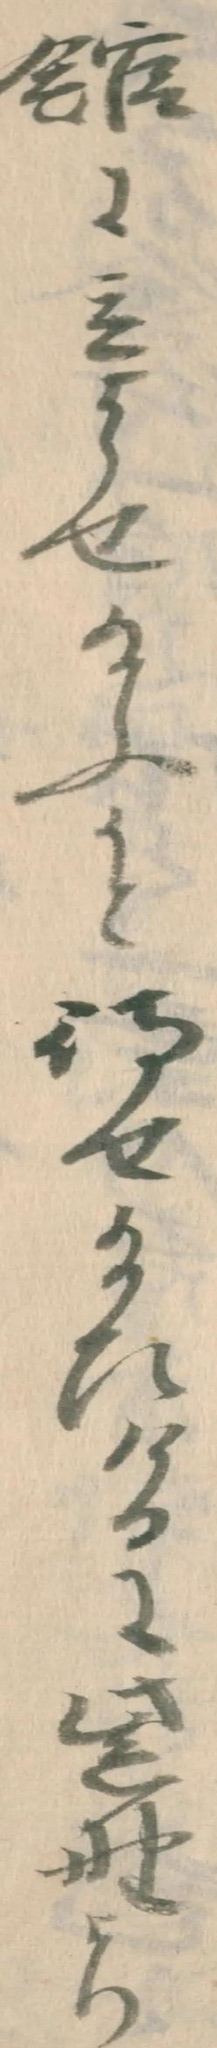館に立よらせ給ふかと待せ給ひけるに紫野より
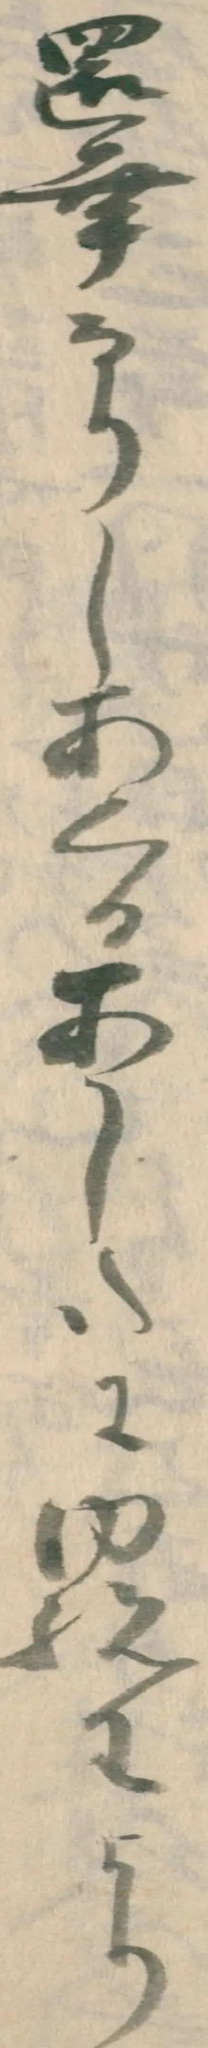還幸なりしあくるあしたに内親王より
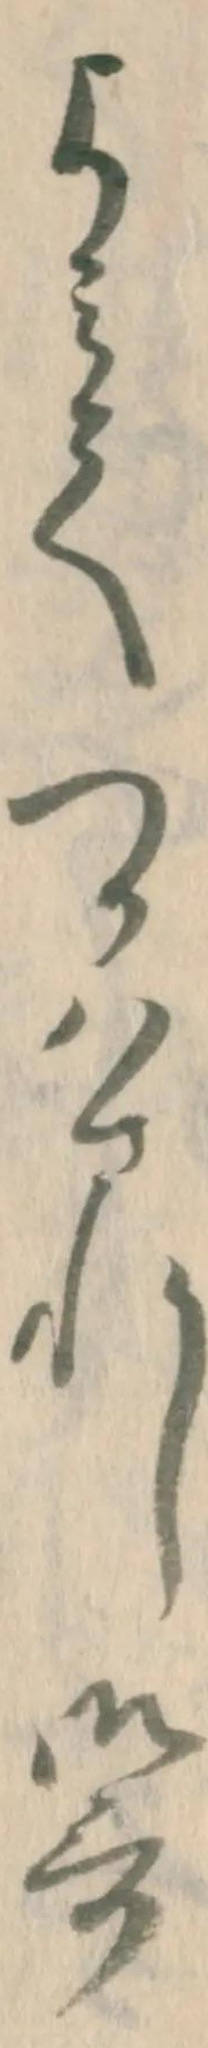よみてつかはされし御哥

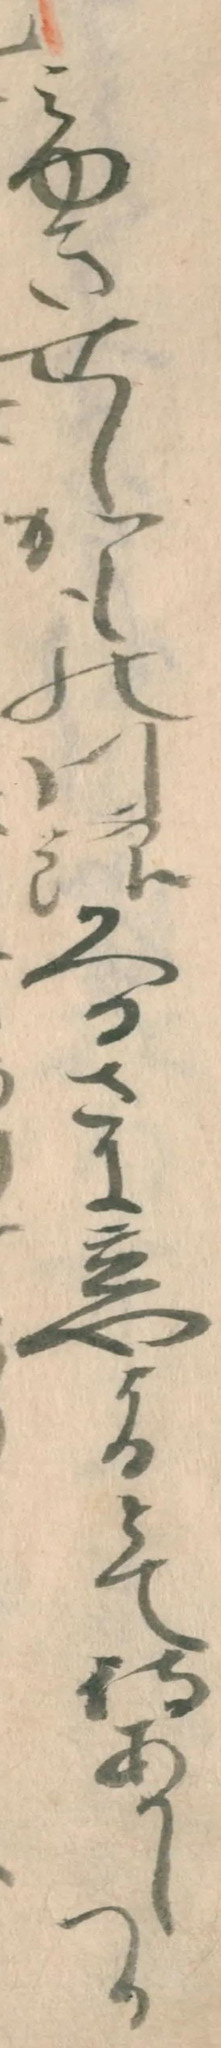みゆきせしかもの川浪かへるさに立やよるとて待あかしつる
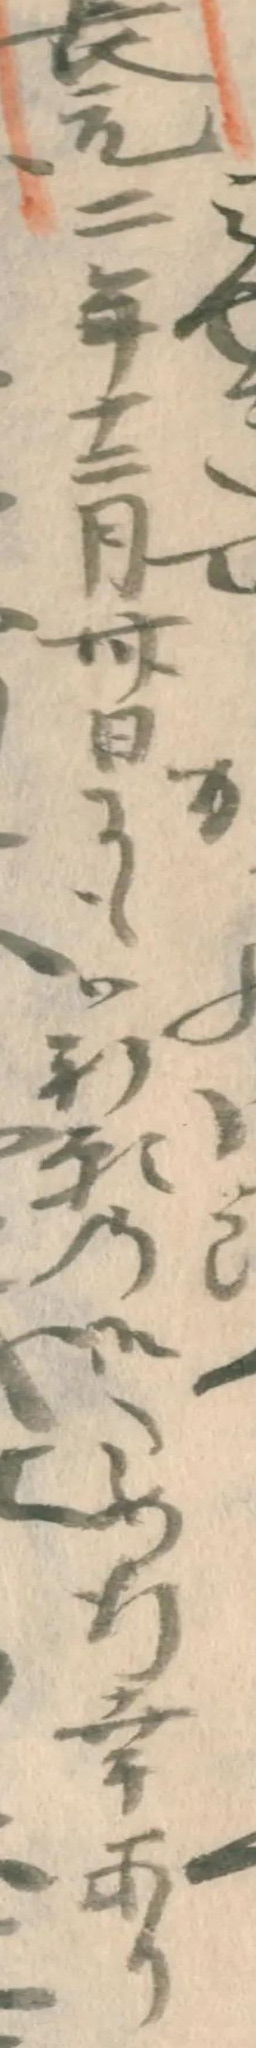長元二年十二月卅日にも御祈願の御ため行幸あり
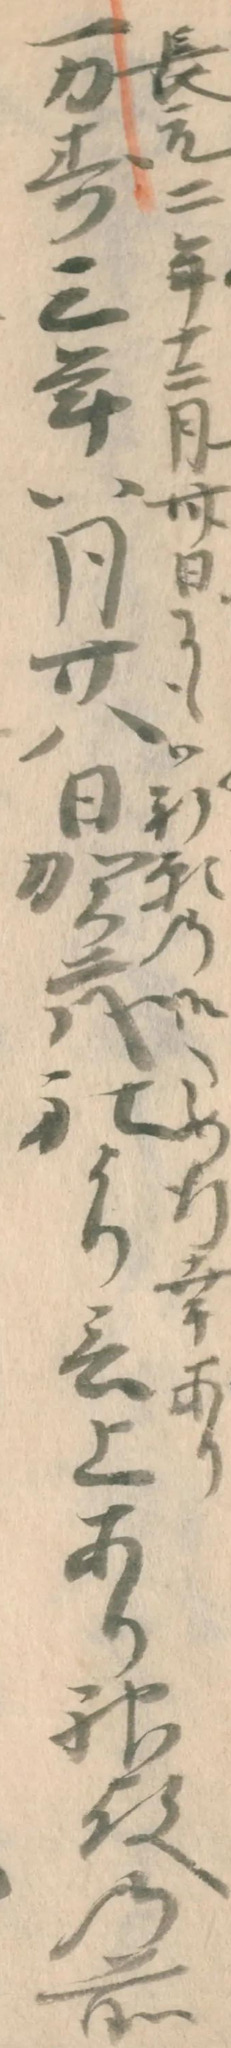万寿三年八月廿八日賀茂社より言上あり神殿の前
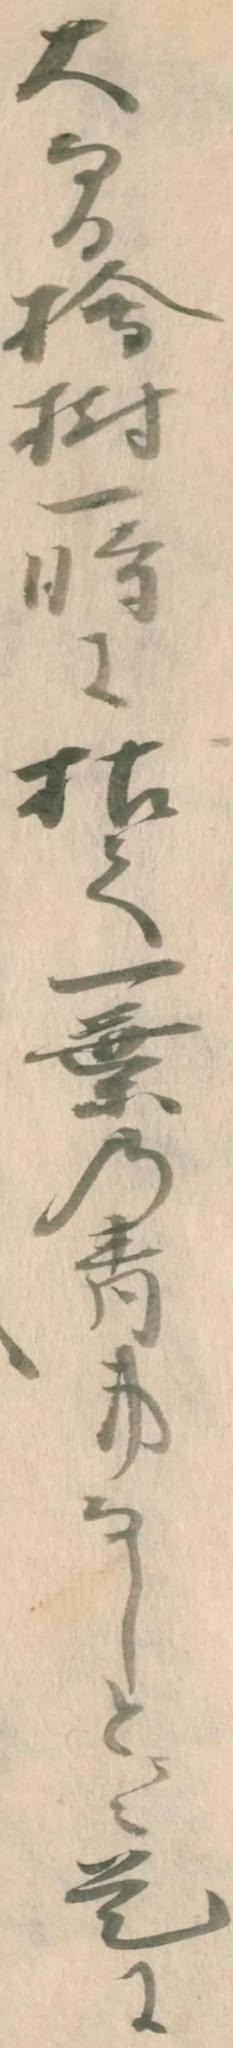大なる檜樹一時に枯て一葉の青事なしと云々是に
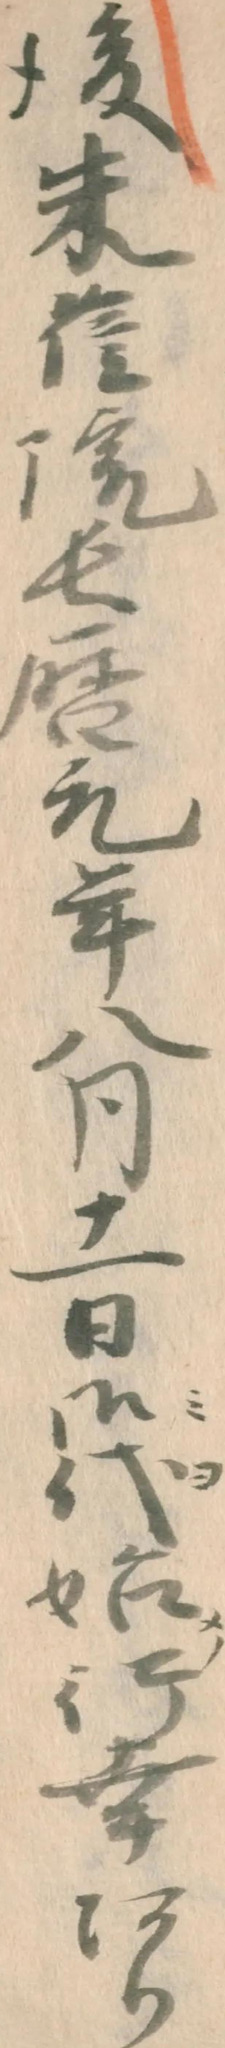後朱雀院長暦元年八月十一日御代始行幸あり
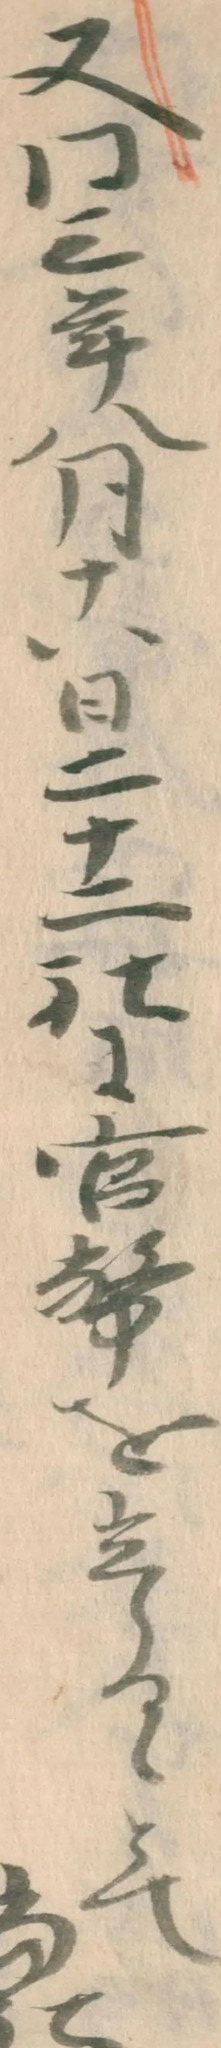又同三年八月十八日二十二社に官幣を立らるゝとて当社
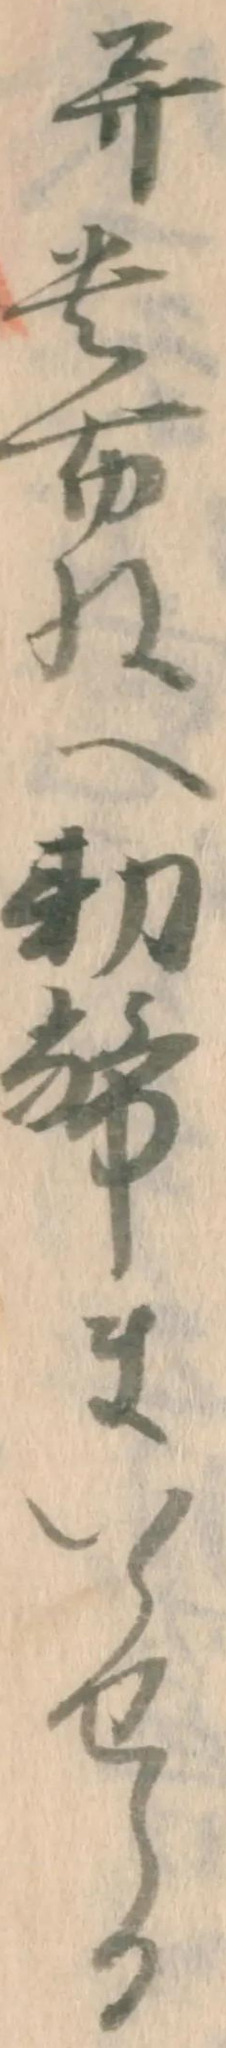并貴ふねへ勅幣まいらせらる
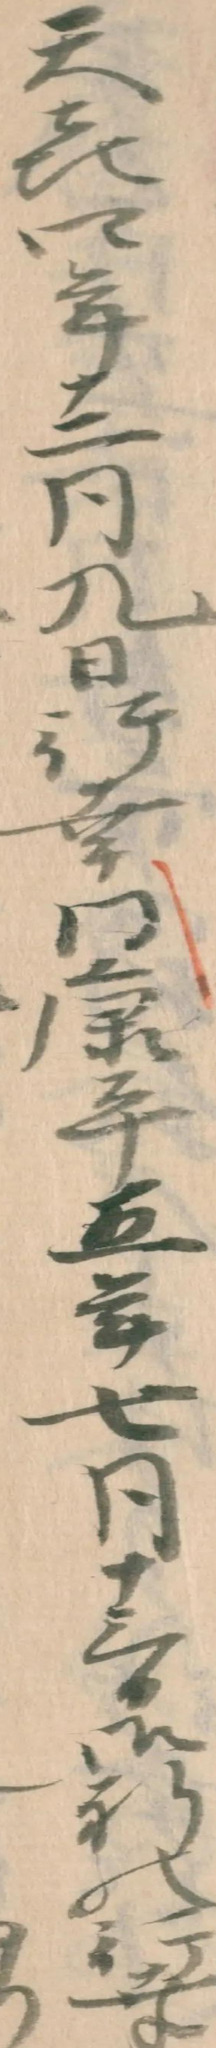天喜四年十二月九日行幸同康平五年七月十三日御祈の行幸なり
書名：賀茂社記録. 第1冊
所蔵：国立国会図書館 National Diet Library, JAPAN
